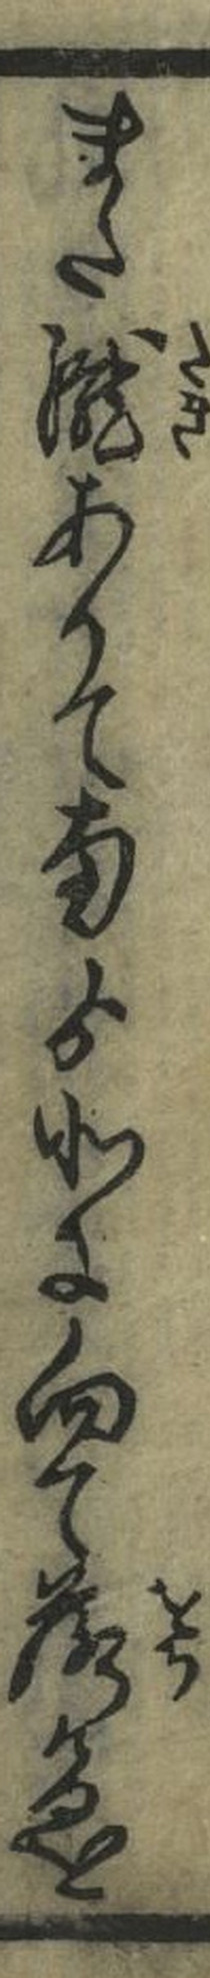また瀧ありて南ゟ北に向て落けるを

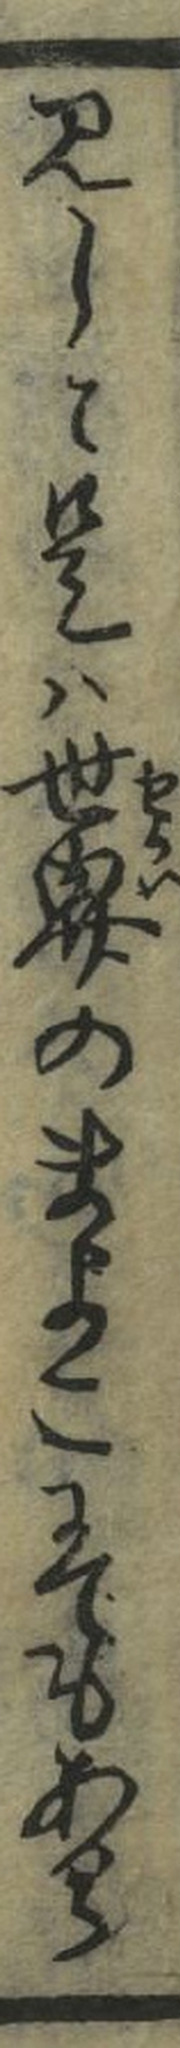見しと是は世界のまよこにてもあるら
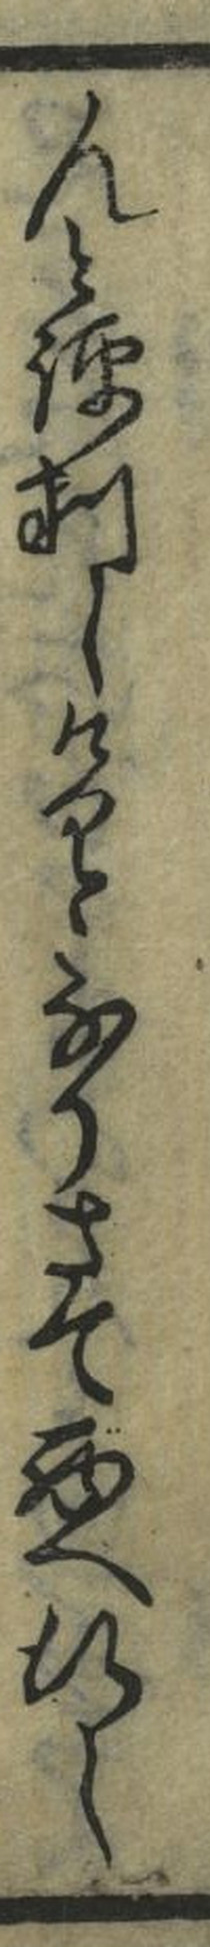んと評判しけるとなりさて西へ行し
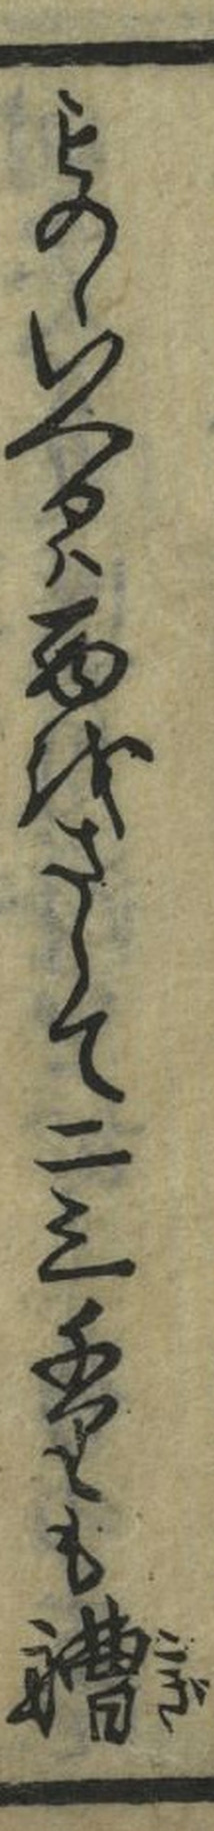ものゝいへるは西をさして二三千里も漕
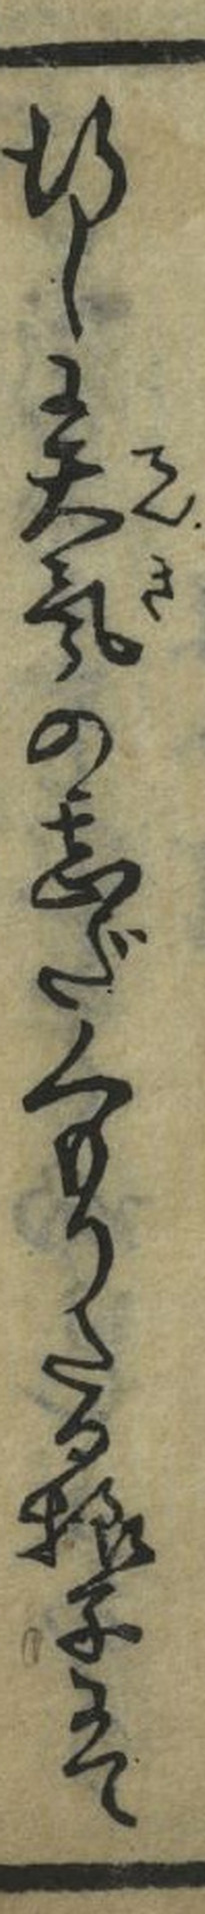行しに天気の甚だくもりたる様子にて
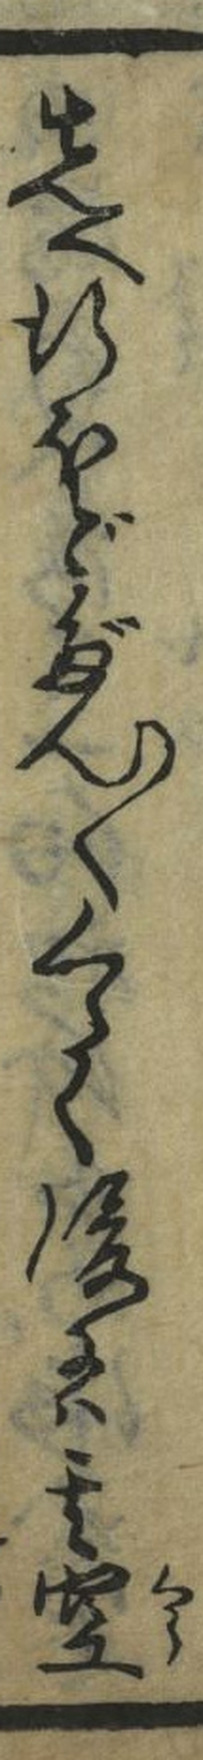先へ行ほどだん〳〵くらく後には其空
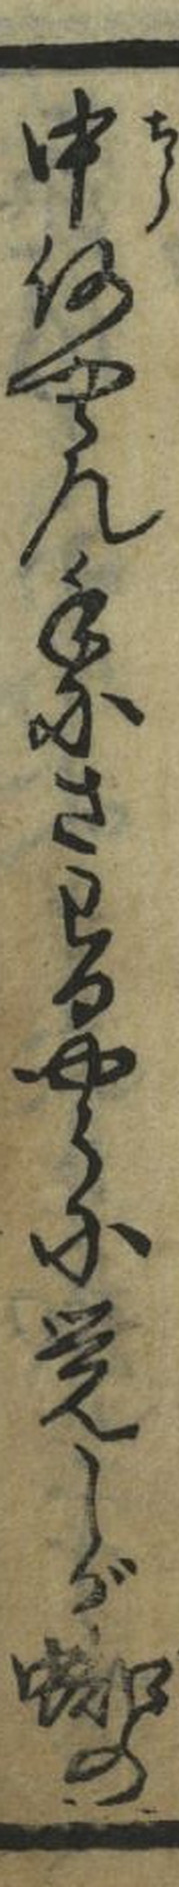中何やらん手にさわるやうに覚しが蜘の
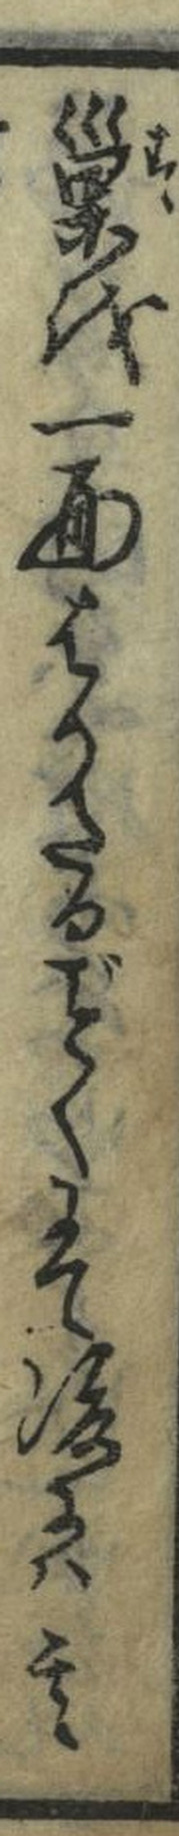巣を一面はりたるごとくにて後には其
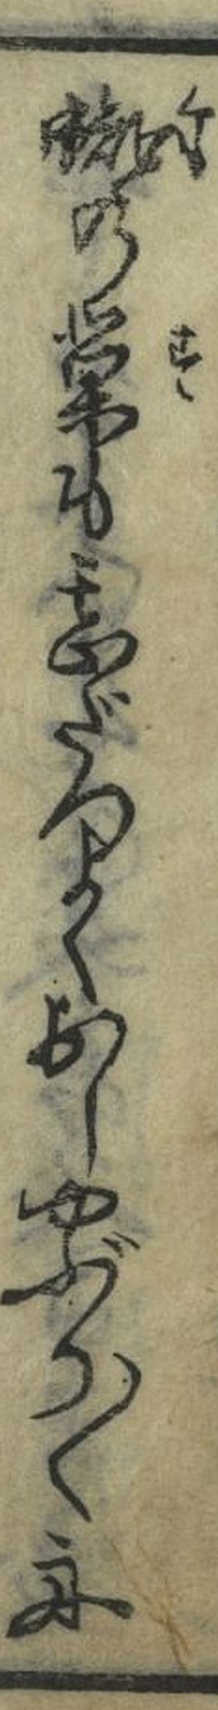蜘の巣も甚だつよくおしやぶり〳〵舟
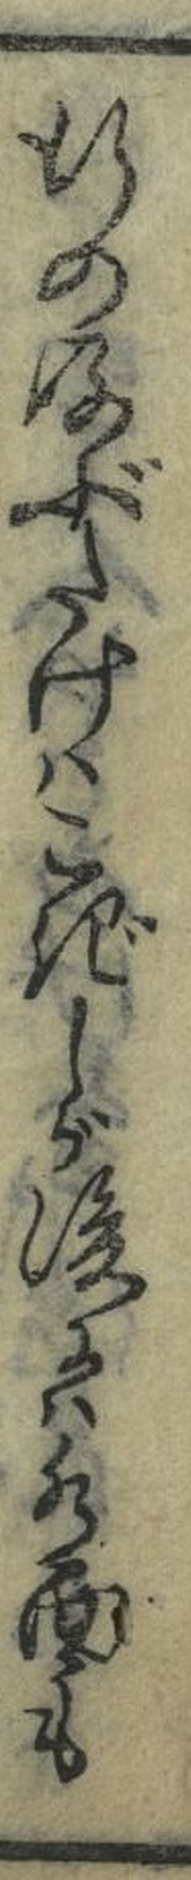行の及ぶたけはこぎしが後には水面も
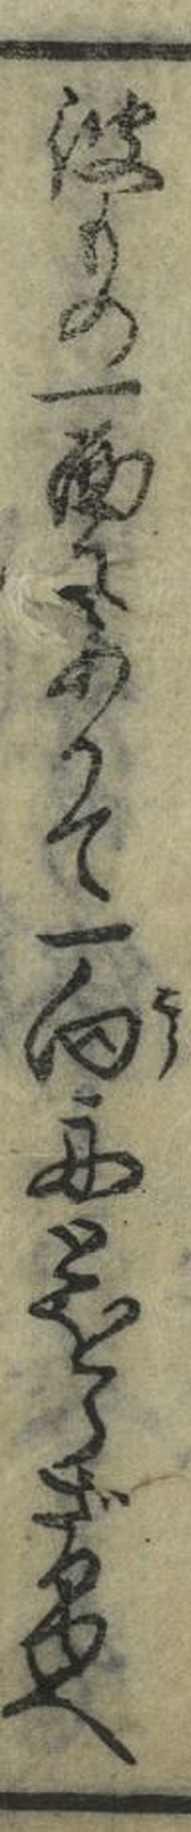彼もの一面にありて一向舟とをらざるゆへ
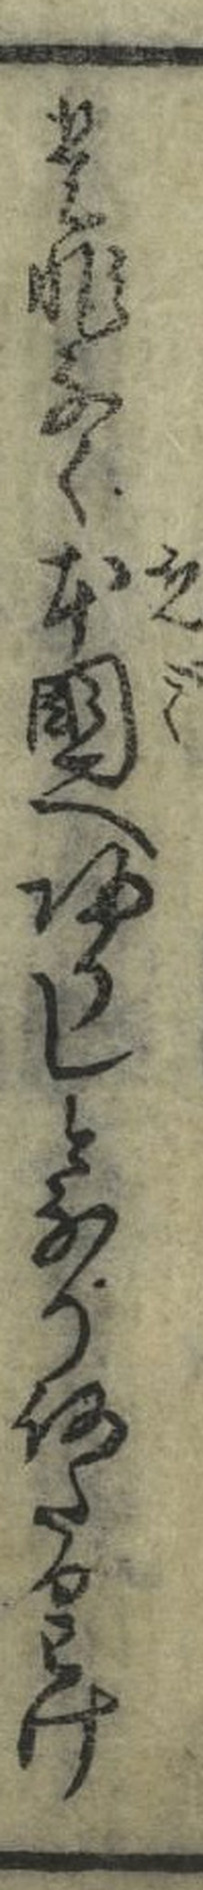是非なく本国へ帰りしとなり何たるわけ
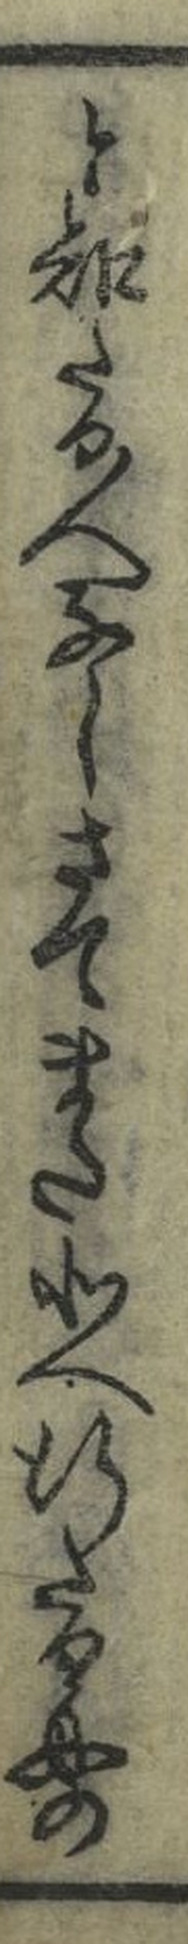と知たる人なしさてまた北へ行たる舟の

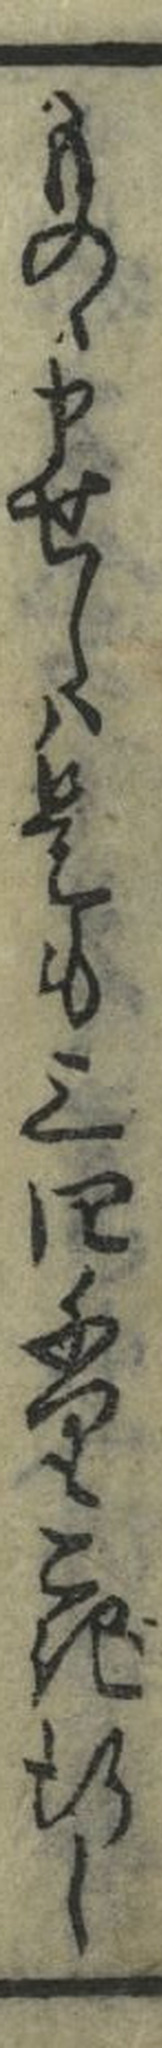ものゝ申せしは是も三四千里もこぎ行し
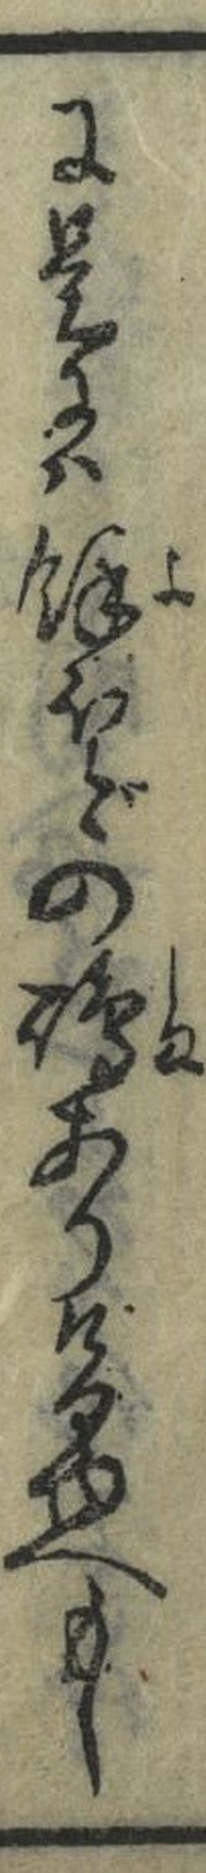に是には余ほどの島ありけるゆへもし
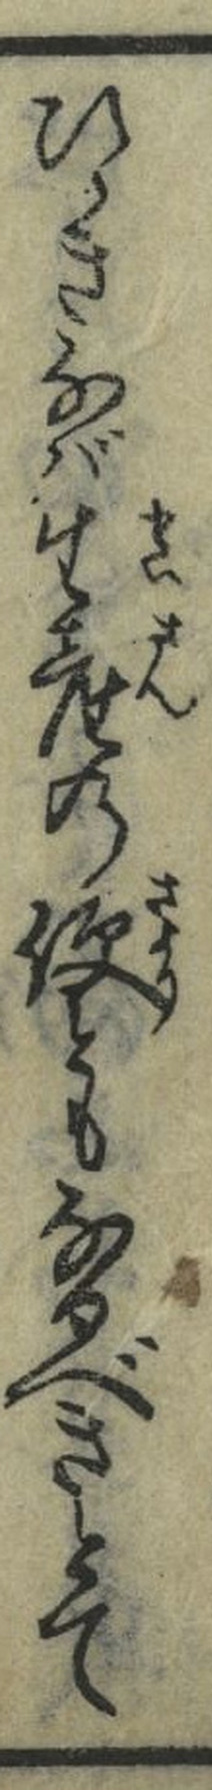ひらきなば生産の便ともなるべきとて
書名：琉球雑話
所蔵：University of the Ryukyus Library
